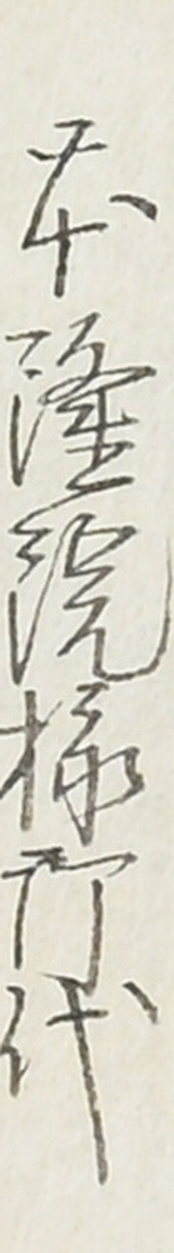本隆院様御代
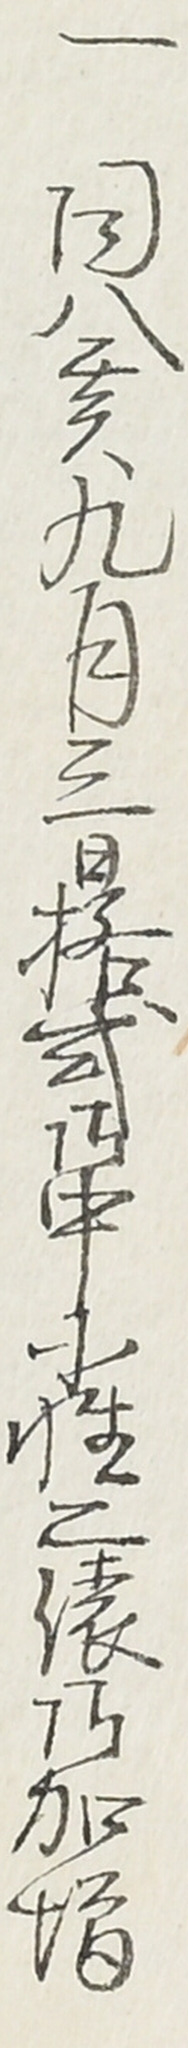一同八亥九月三日格式御中小性二俵御加増
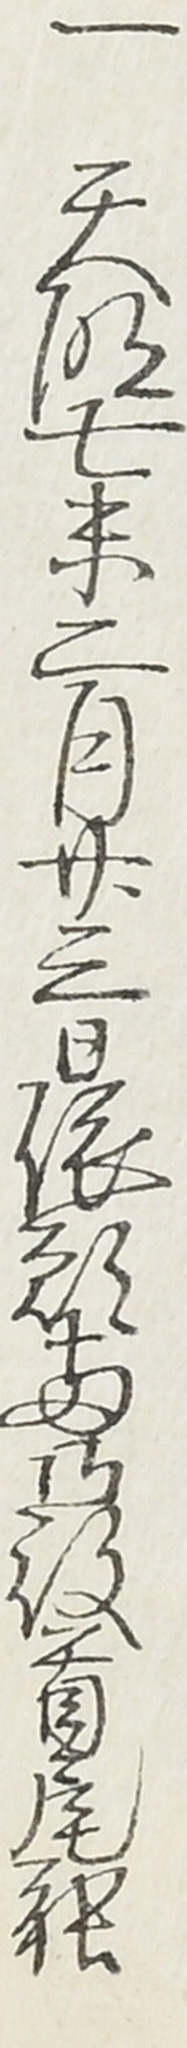一天明七未二月廿三日依願両御役首尾能
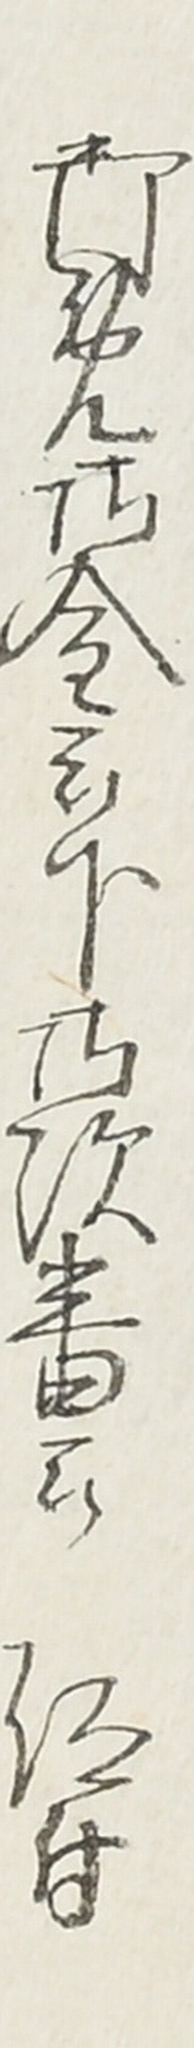御免御金被下御次番被仰付
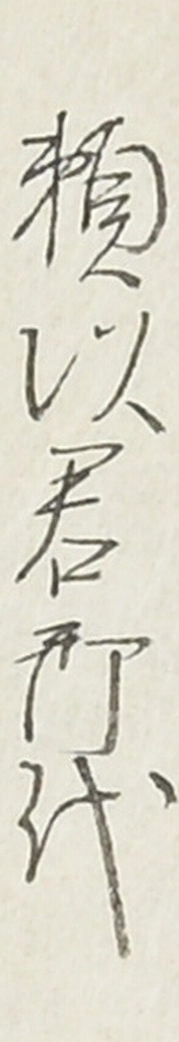頼以君御代
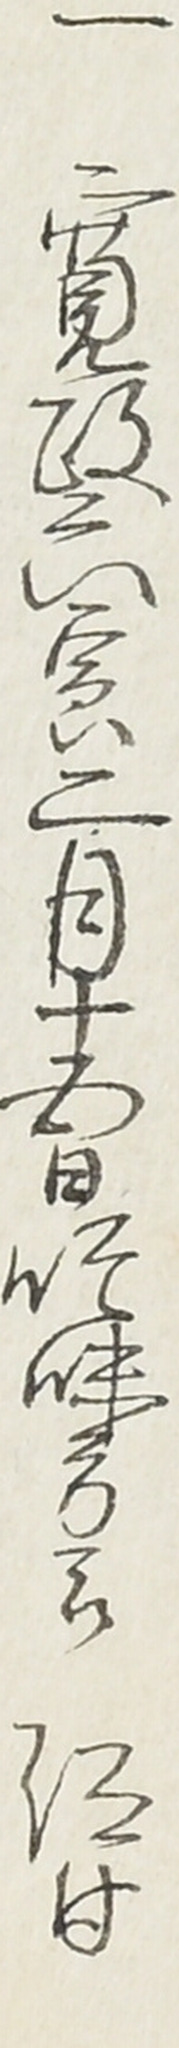一寛政六寅二月十五日吟味方被仰付
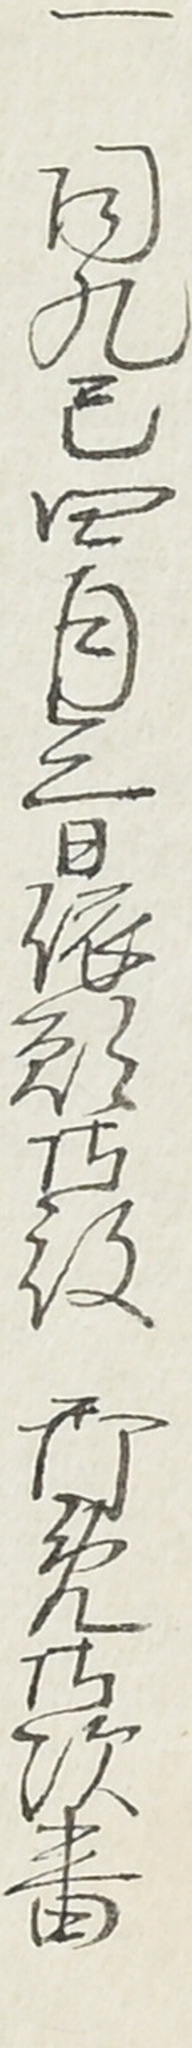一同九巳四月三日依願御役御免御次番
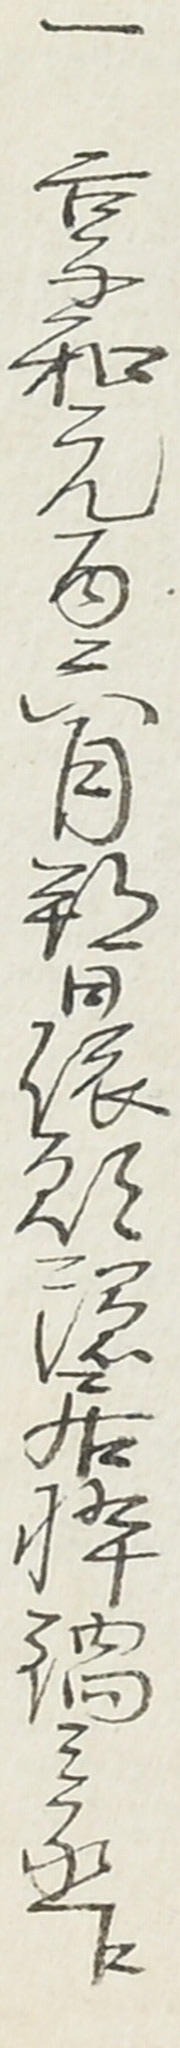一享和元酉六月朔日依願隠居忰鍋之丞江
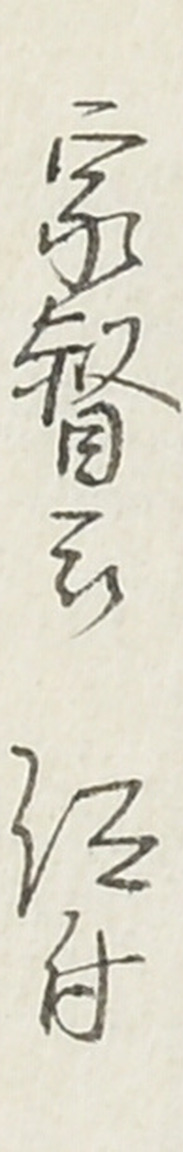家督被仰付

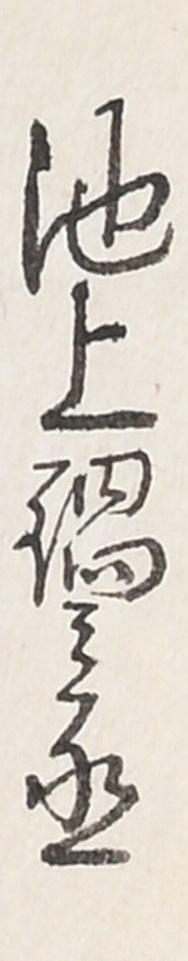池上鍋之丞
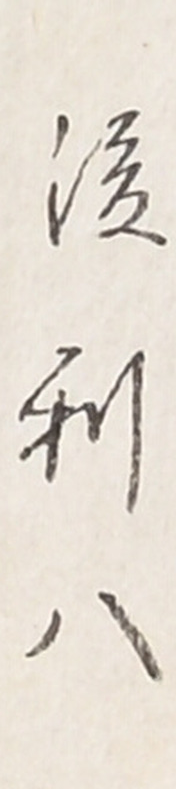後利八
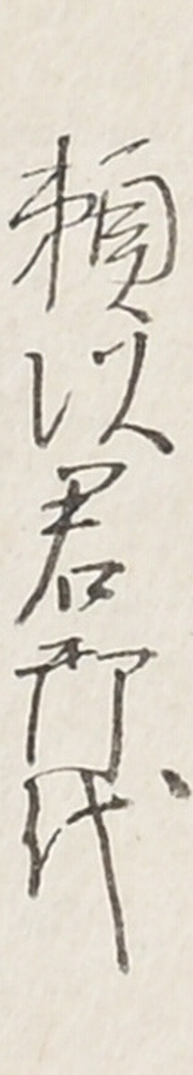頼以君御代
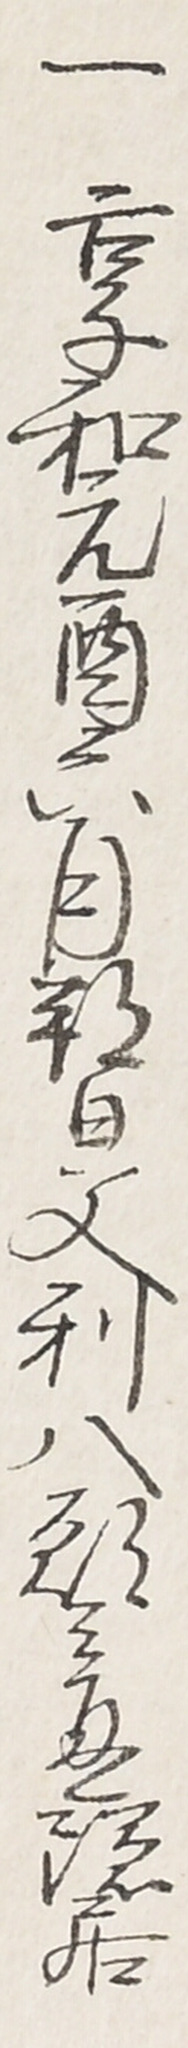一享和元酉六月朔日父利八願之通隠居
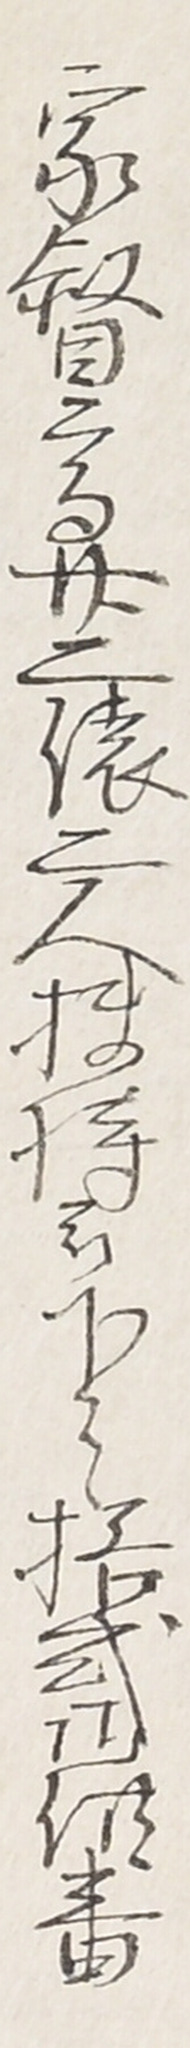家督高廿二俵二人扶持被下之格式御供番
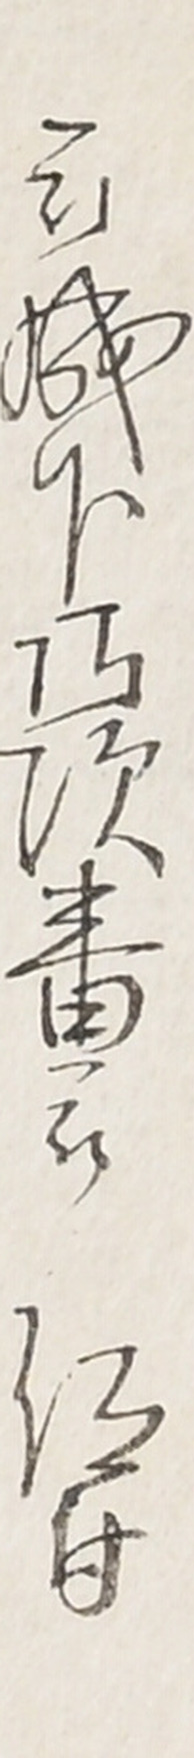被成下御次番被仰付
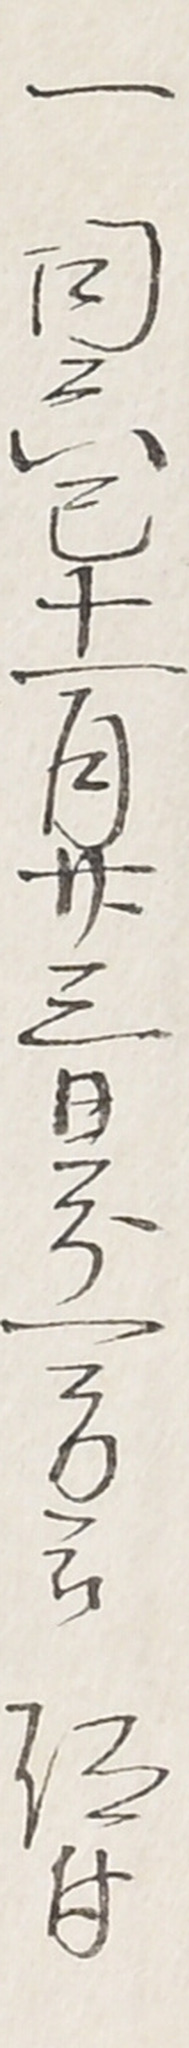一同六巳十一月廿三日分一方被仰付
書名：無足諸士勤仕録（四）
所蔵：伊那市立高遠町図書館・合同会社AMANE
